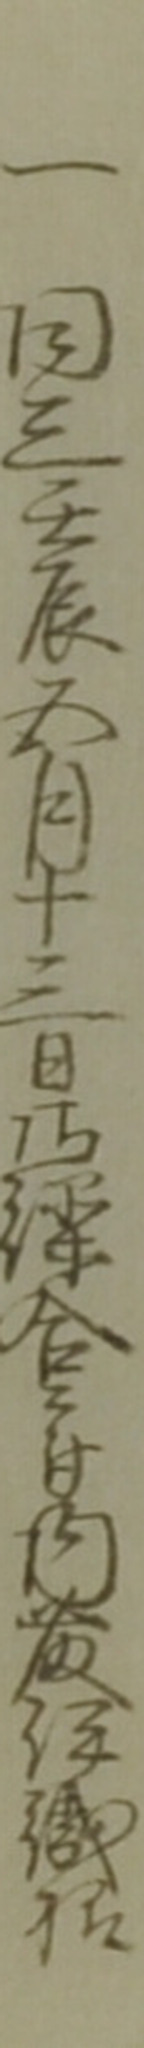一同三壬辰五月十三日御繰合ニ付内藤伊織様
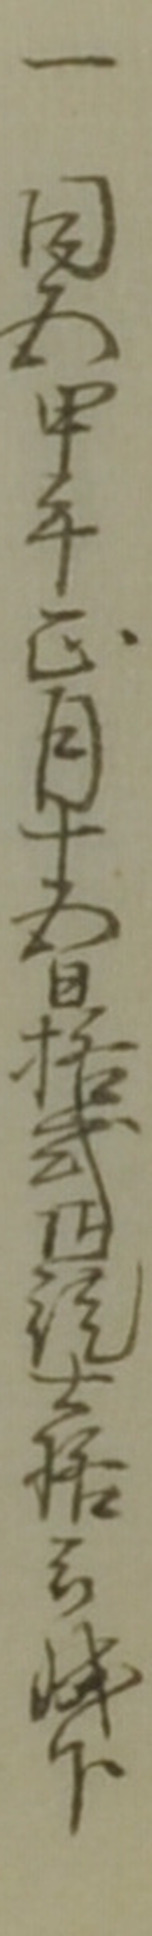一同五甲午正月十五日格式御徒士格被成下
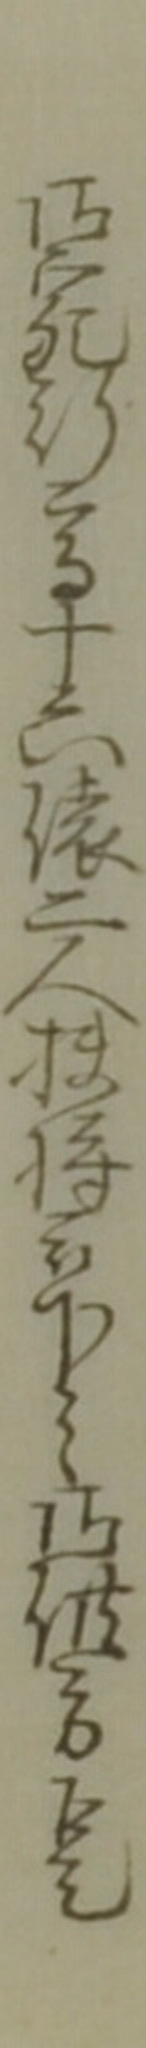御宛行高十六俵二人扶持被下之御供方是
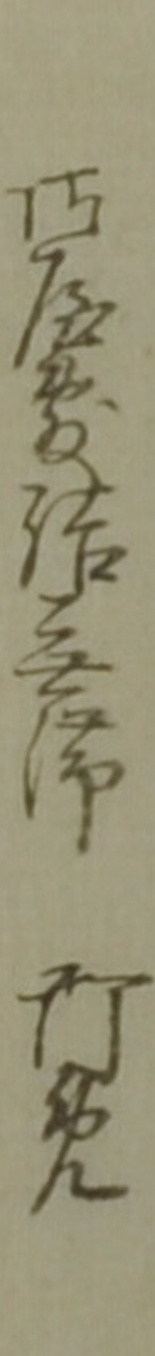御屋敷詰無滞御免
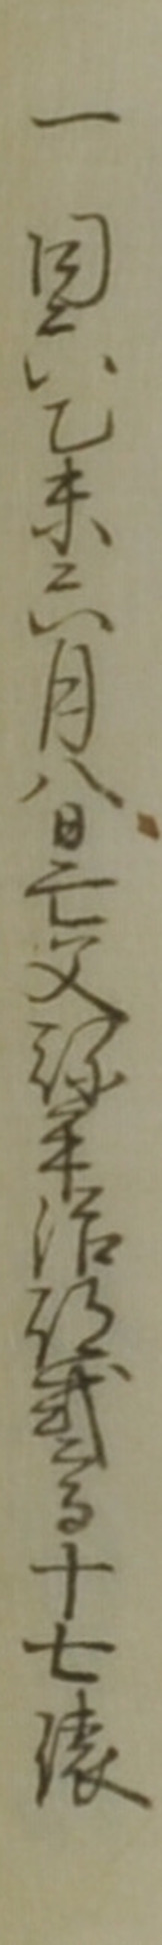一同六乙未六月八日亡父弥平治跡式高十七俵
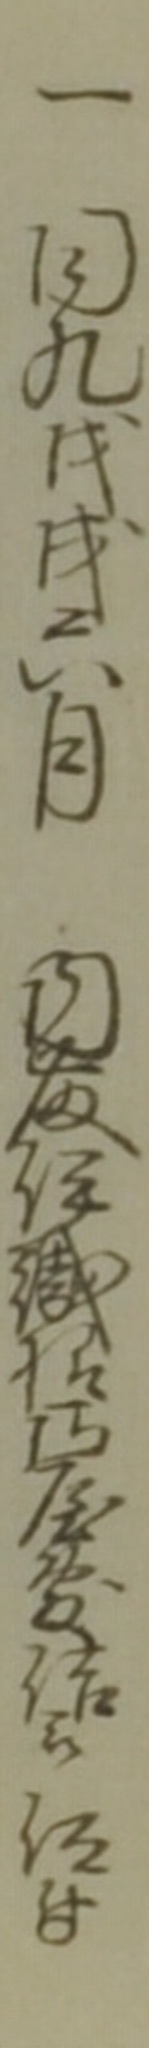一同九戊戌六月内藤伊織様御屋敷詰被仰付
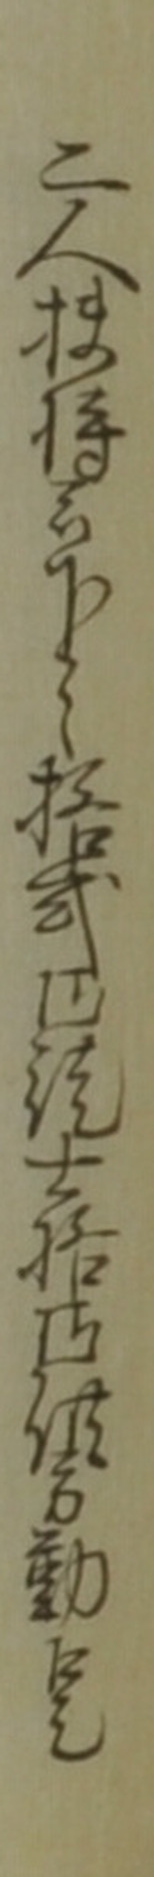二人扶持被下之格式御徒士格御供方勤是
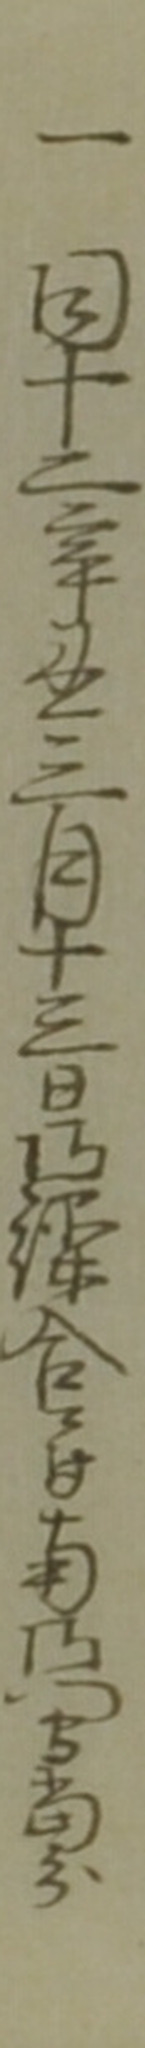一同十二辛丑三月十三日御繰合ニ付南御門守当分
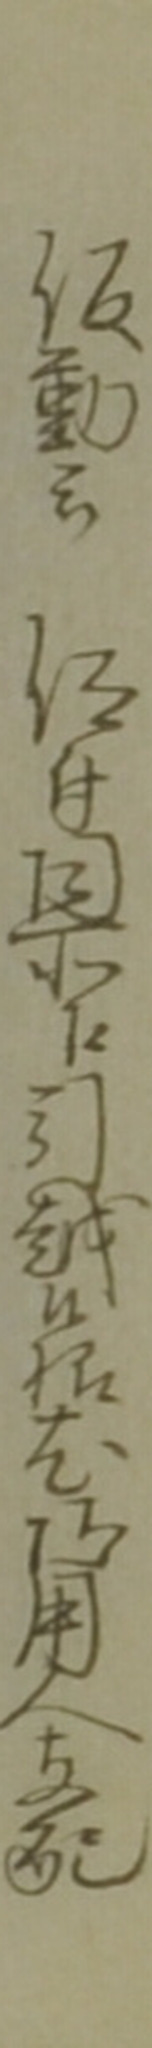仮勤被仰付同所江引越候様尤御用人支配
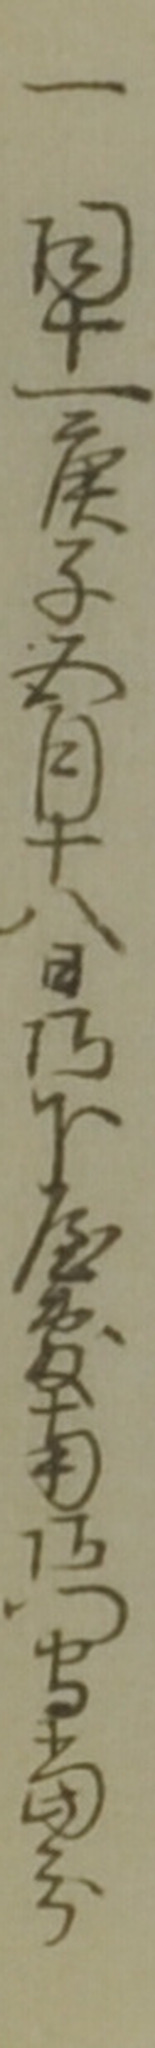一同十一庚子五月十八日御下屋敷南御門守当分
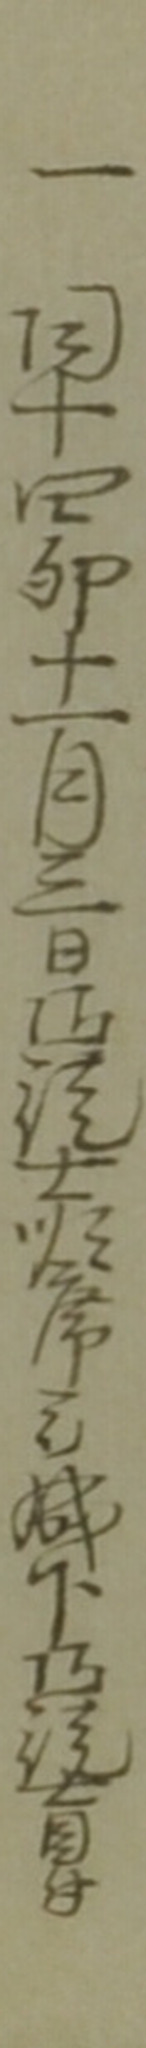一同十四卯十一月三日御徒士順席被成下御徒士目付
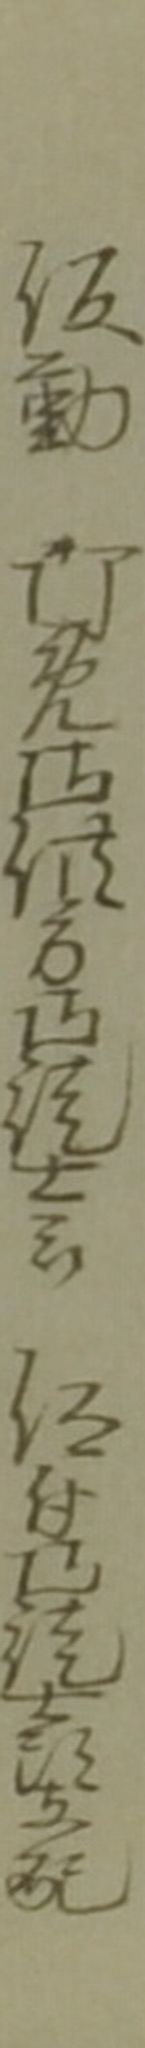仮勤御免御供方御徒士被仰付御徒士頭支配
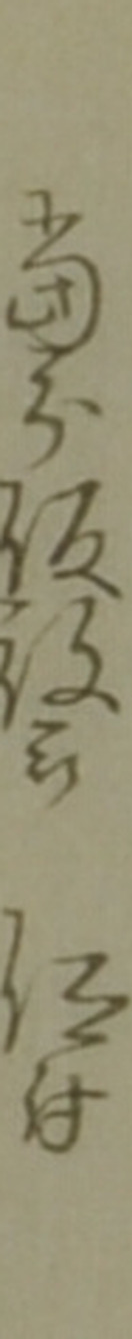当分仮役被仰付
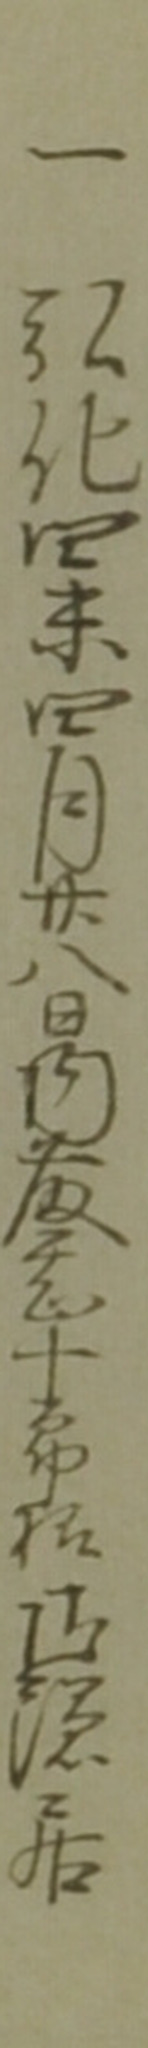一弘化四未四月廿八日内藤甚十郎様御隠居
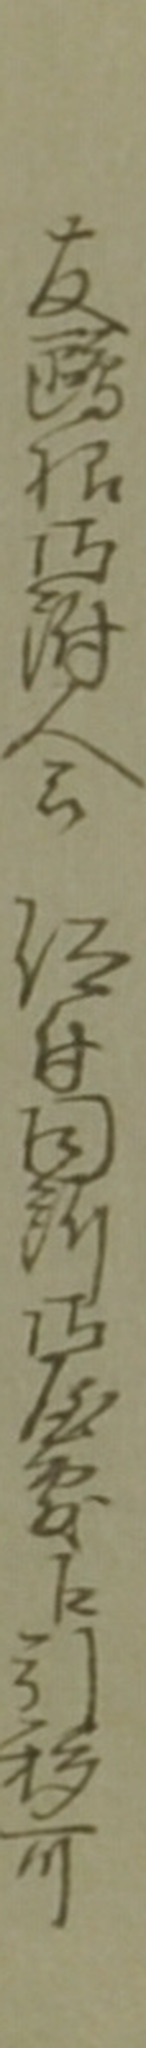友鴎様御附人被仰付同所御屋敷江引移可
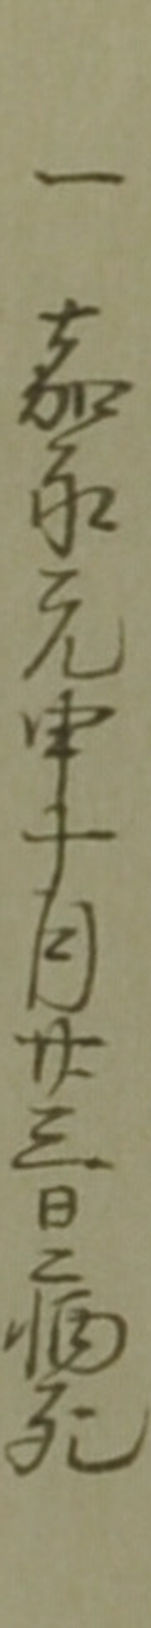一嘉永元申十月廿三日病死
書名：無足諸士勤仕録（七）
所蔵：伊那市立高遠町図書館・合同会社AMANE
